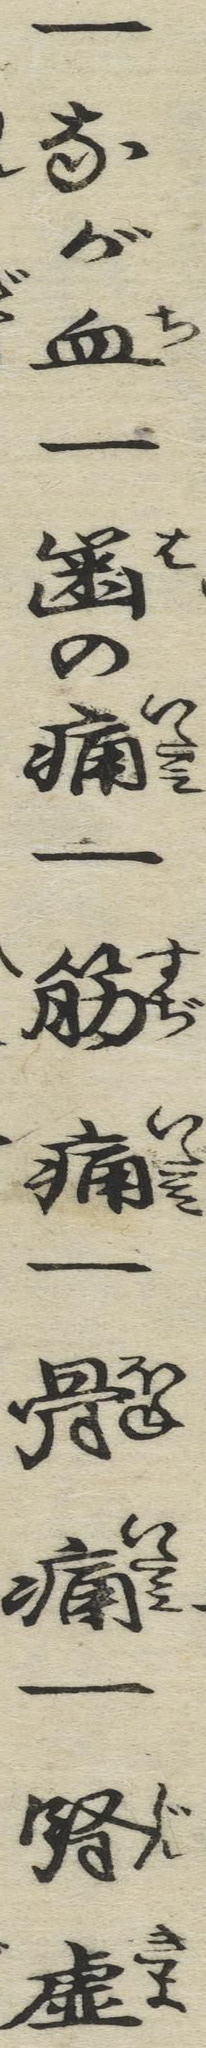一なが血一歯の痛一筋痛一骨痛一腎虚
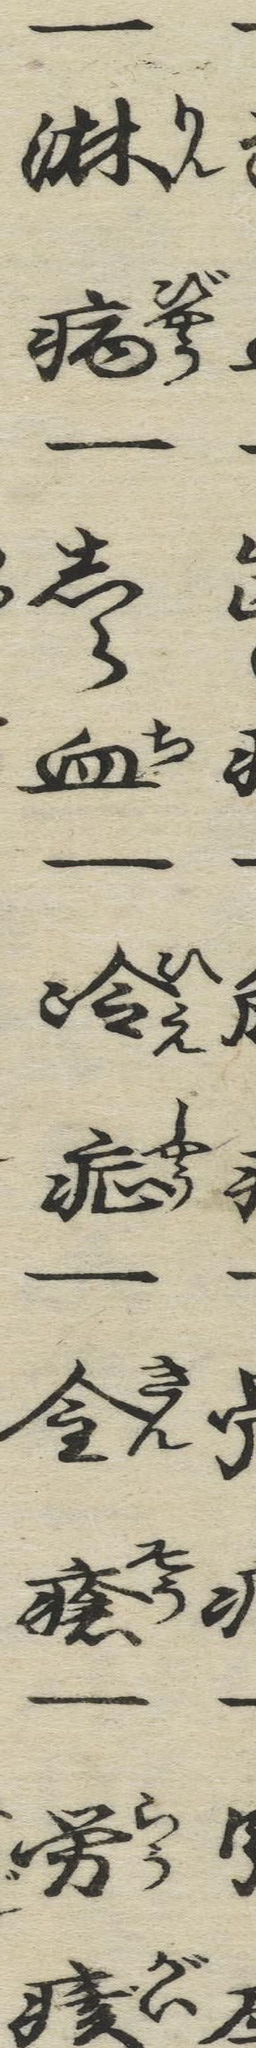一淋病一しら血一冷症一金瘡一腎虚
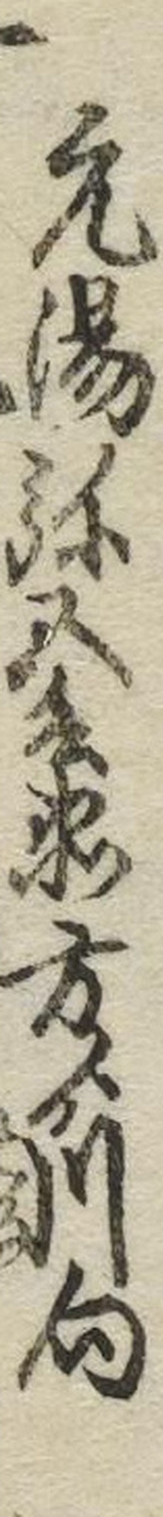元湯弥五兵衛方より川勿
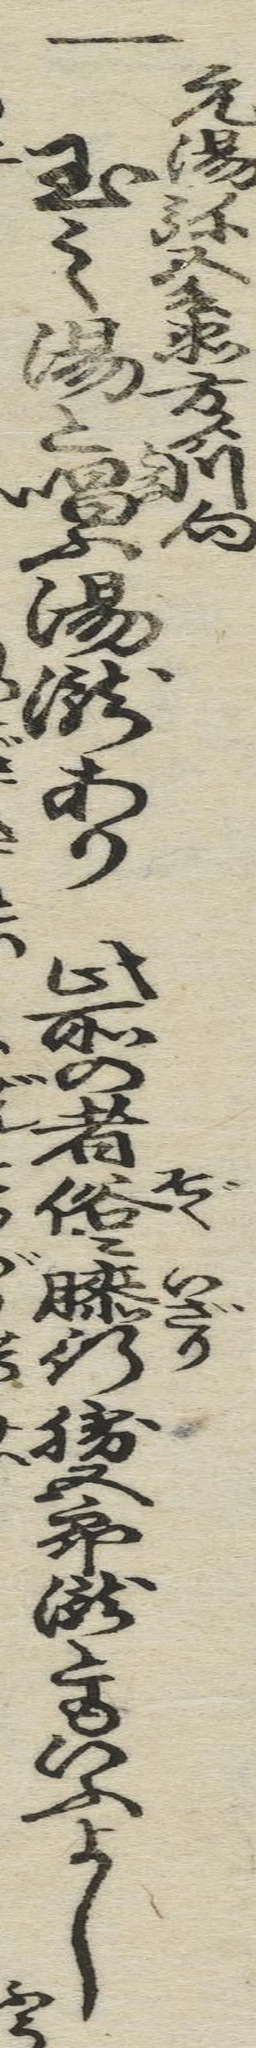一玉之湯と唱ふ湯瀧あり此所の者俗膝行勝五郎瀧ともいふよし
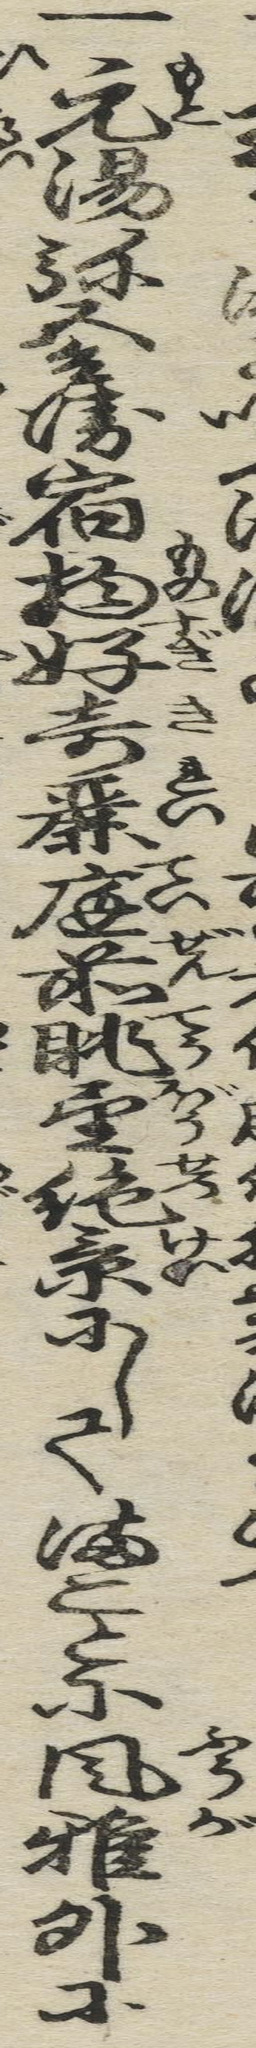一元湯弥五兵衛宿物好奇麗庭前眺望絶景にしてまことに風雅外に
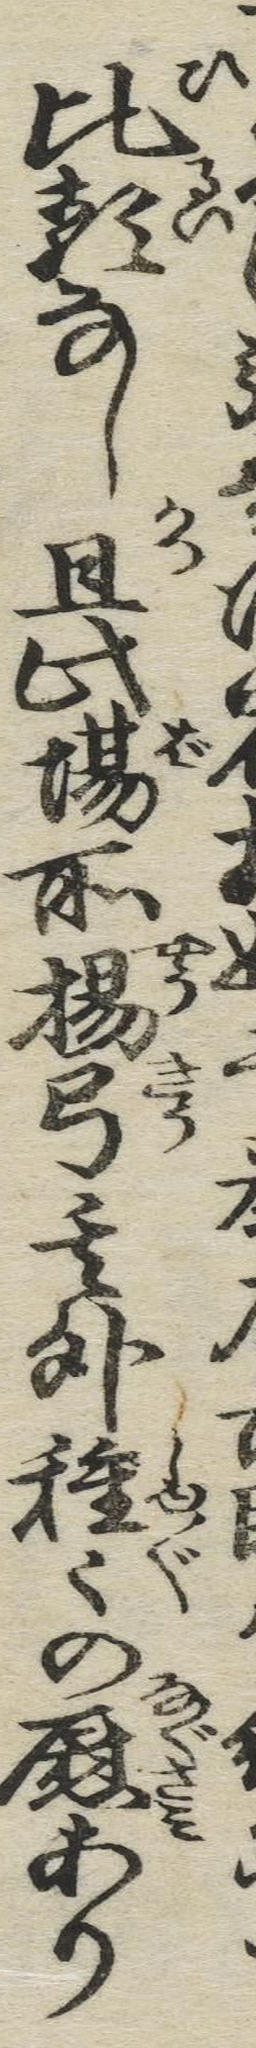比類なし且此場所楊弓其外種々の慰あり
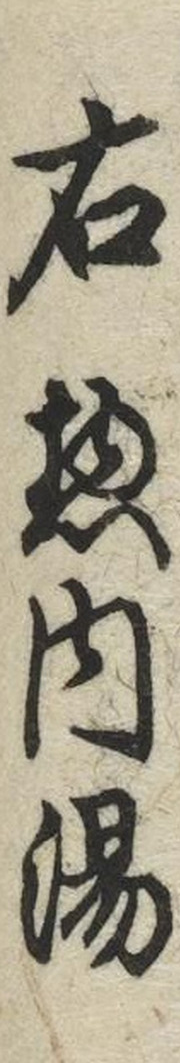右惣内湯
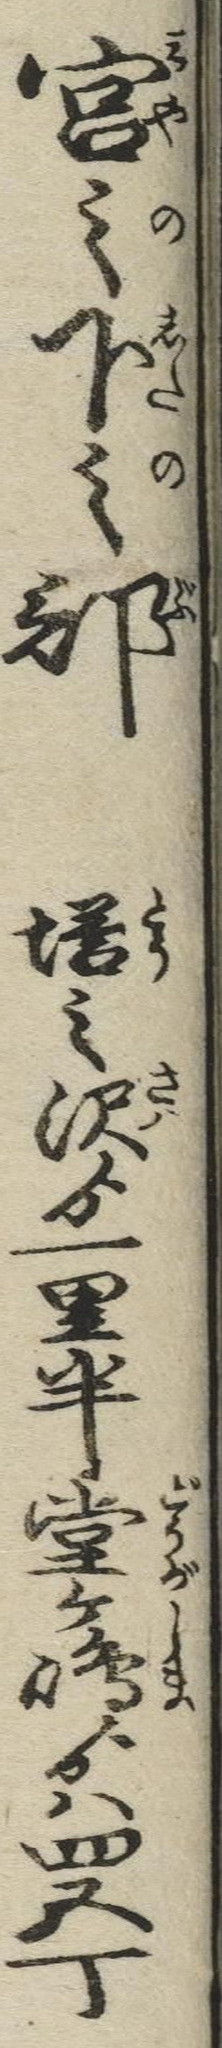宮之下之部塔の沢より一里半堂ヶ嶋よりは四五丁
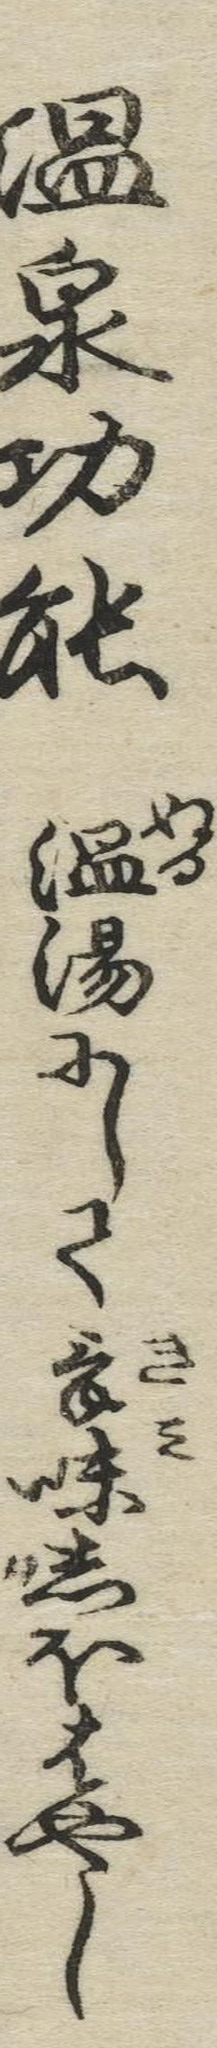温泉功能温湯にして氣味しほはゆし
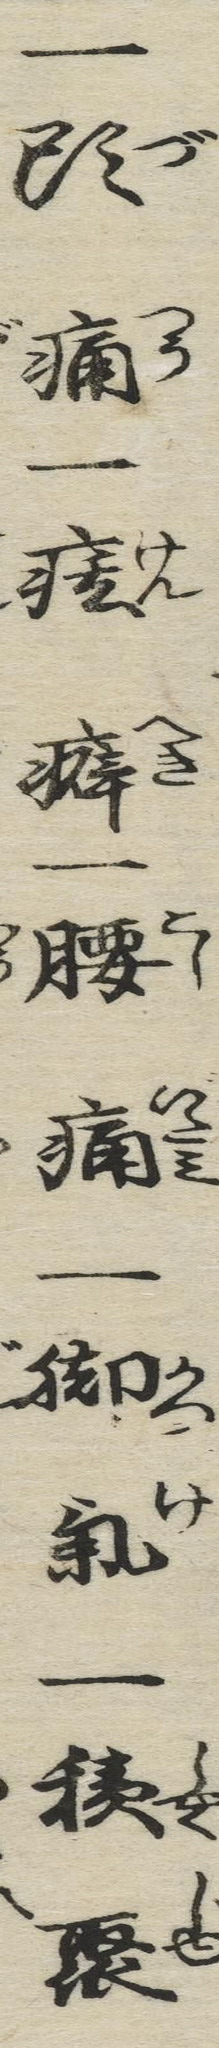一頭痛一痃癖一腰痛一脚氣一積聚
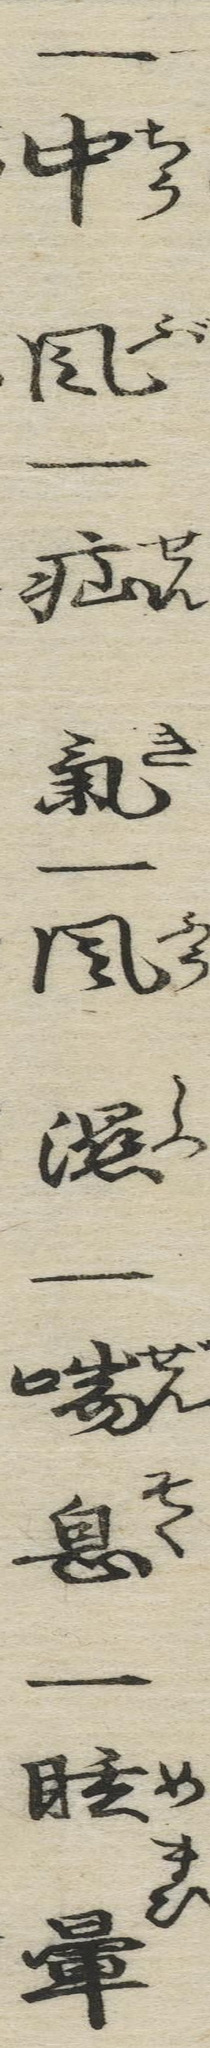一中風一疝気一風疾一喘息一眩暈
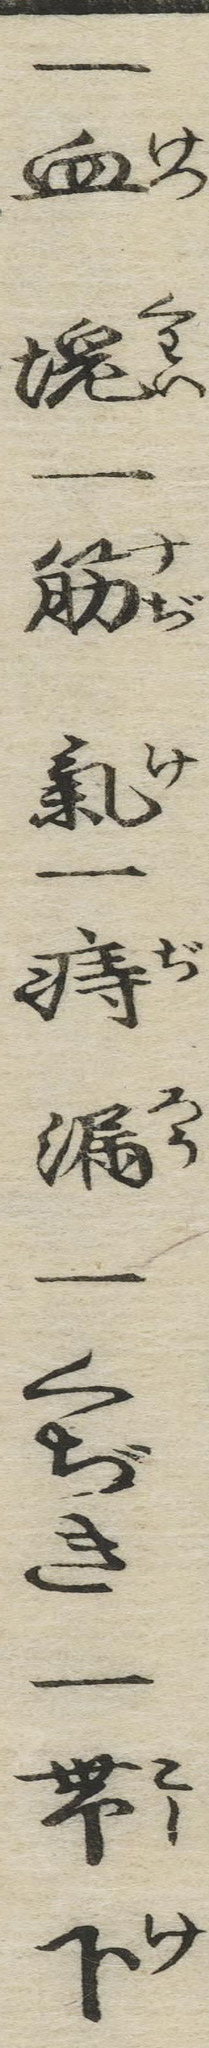一血塊一筋氣一痔瘻一くぢき一帯下
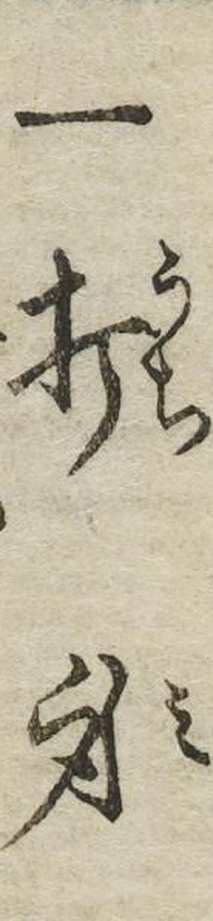一打身
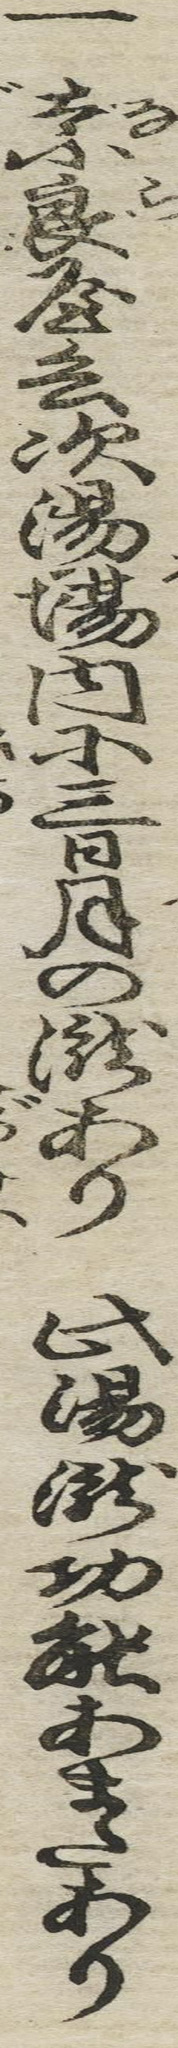一奈良屋兵次湯場内に三日月の瀧あり此湯瀧効能あまたあり
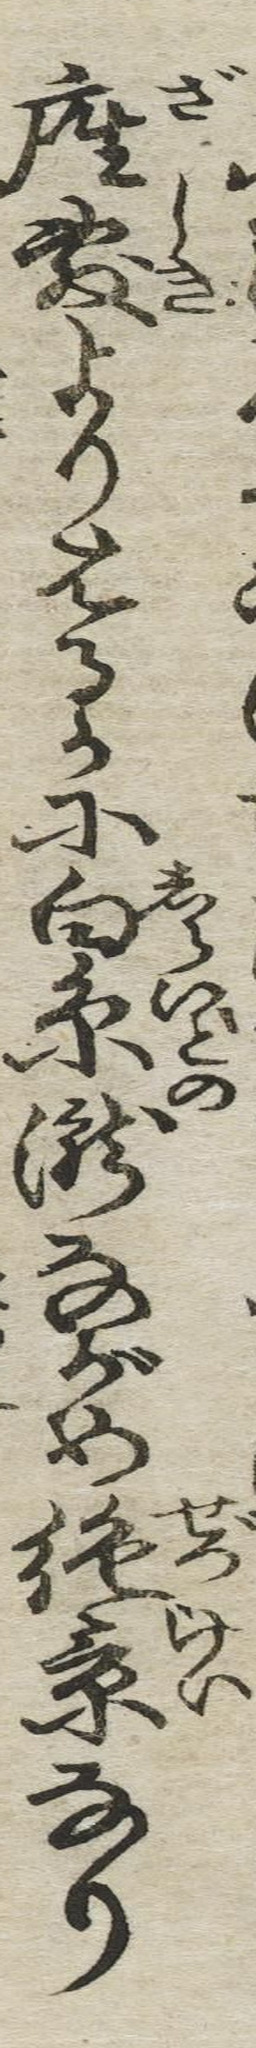座敷よりはるかに白糸瀧ながめ絶景なり
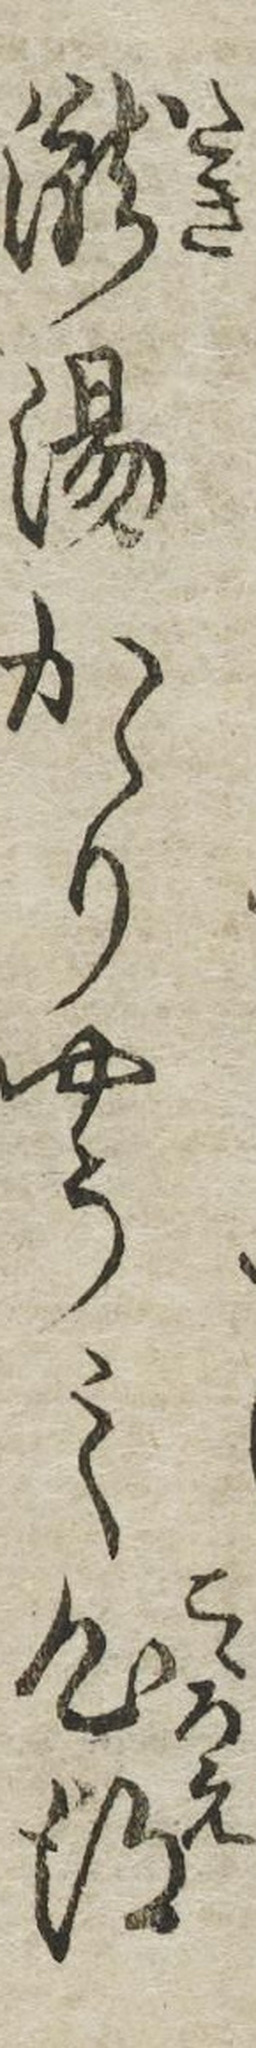瀧湯かゝりやう之心得
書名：箱根七湯　温泉圖會　全
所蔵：東京大学地震研究所図書室 Earthquake Research Institute Library, The University of Tokyo, JAPAN
